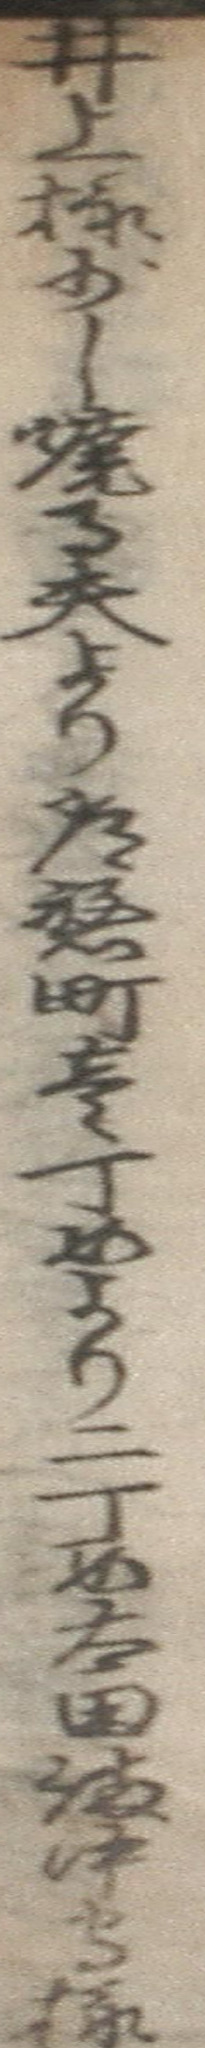井上様少し焼る夫より常盤町壱丁めより二丁め太田備中守様
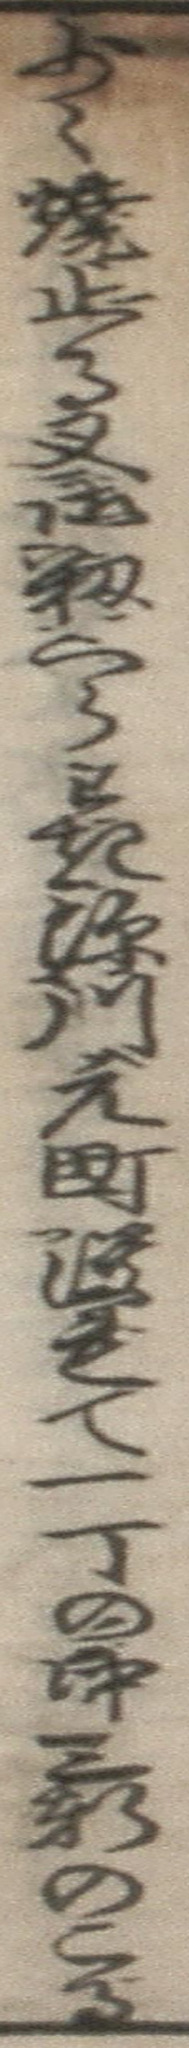少〻焼止る又御籾くらわき深川元町潰れて一丁の中三軒のこる
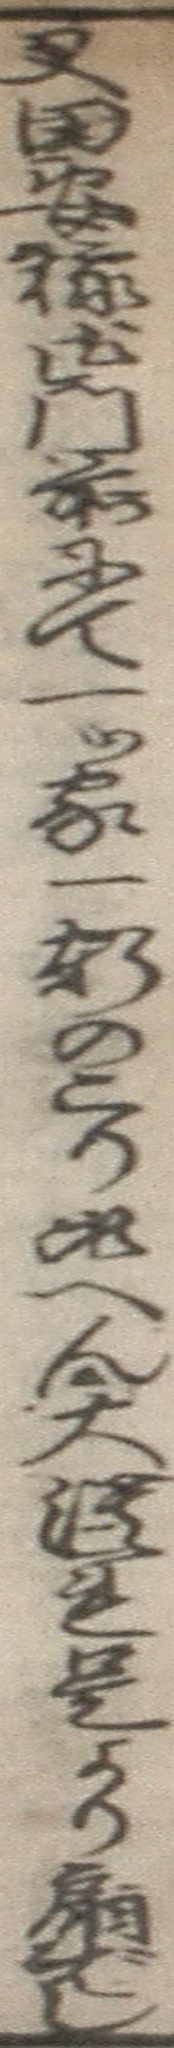又田安様御門前にて一ツ家一軒のこり此へん大潰れ是より扇ばし
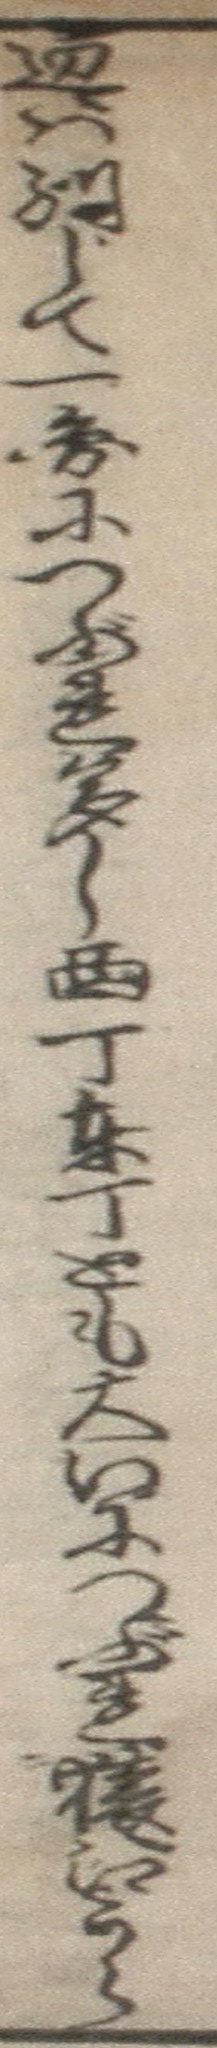辺ハ別して一円につぶれ多し西丁東丁とも大いにつぶれ猿江うら
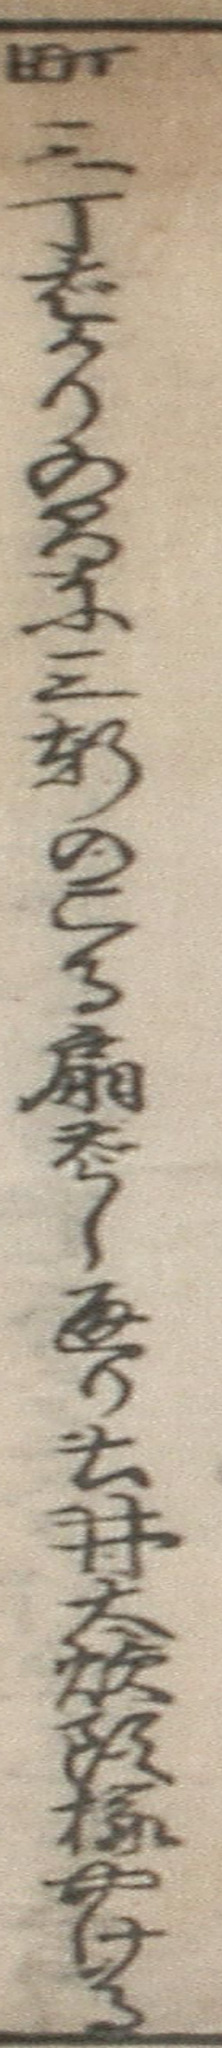町三丁ばかりの間に三軒のこる扇ばし通り土井大炊頭様やける
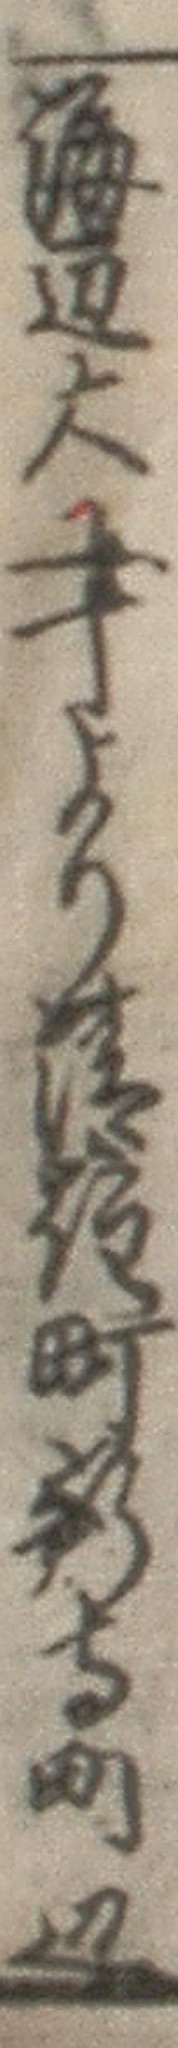海辺大工丁より清住町新寺町辺
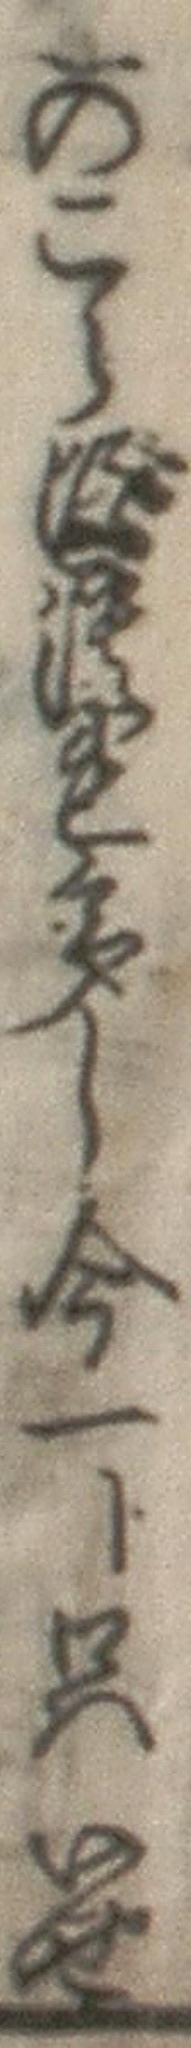のこらず潰れ多し今一ト口ハいせ
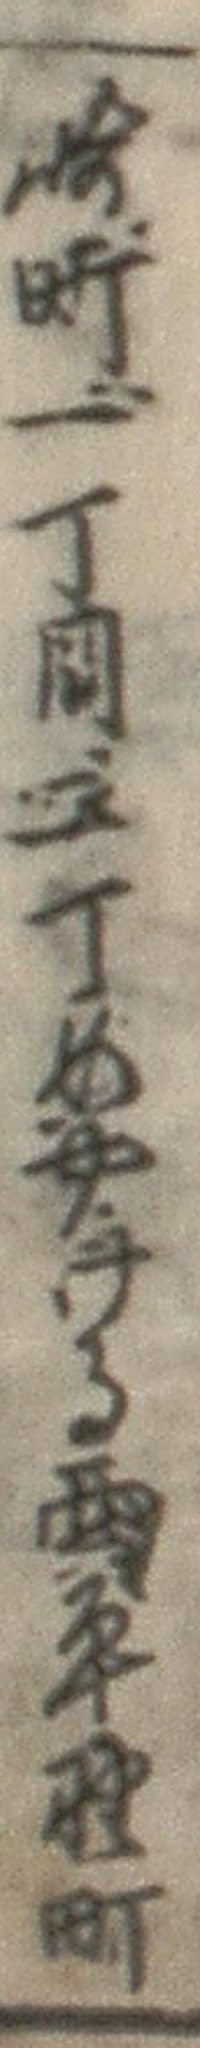崎町一丁目二丁めやける西平野町
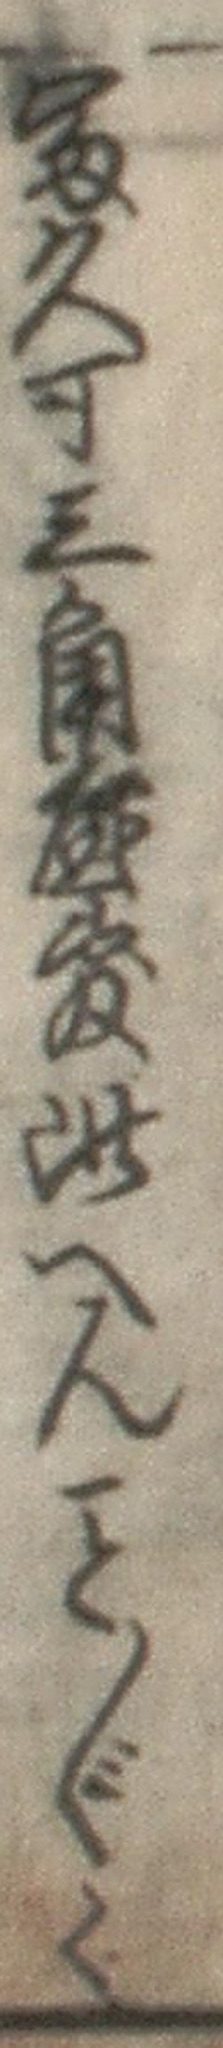富久丁三角屋敷此へんこと〴〵く
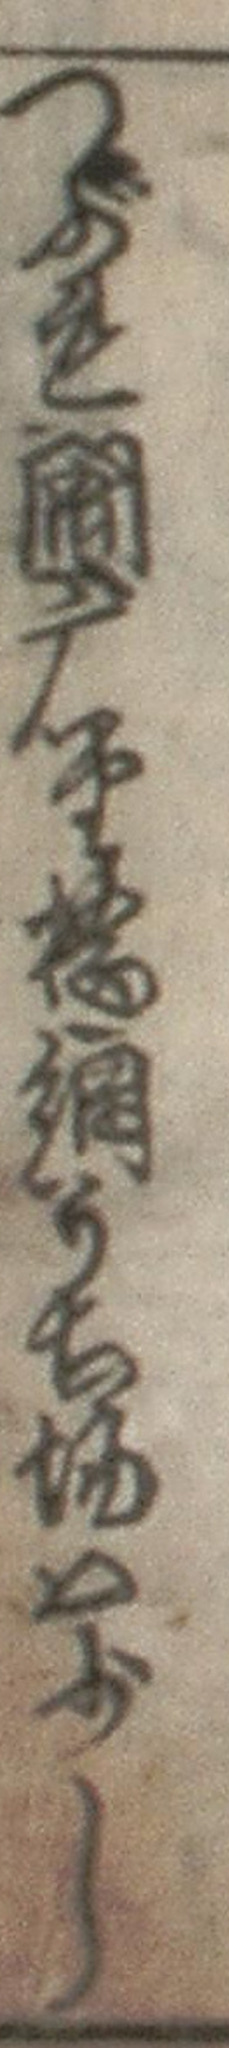つぶれ閻魔堂橋網うち場ハ少し

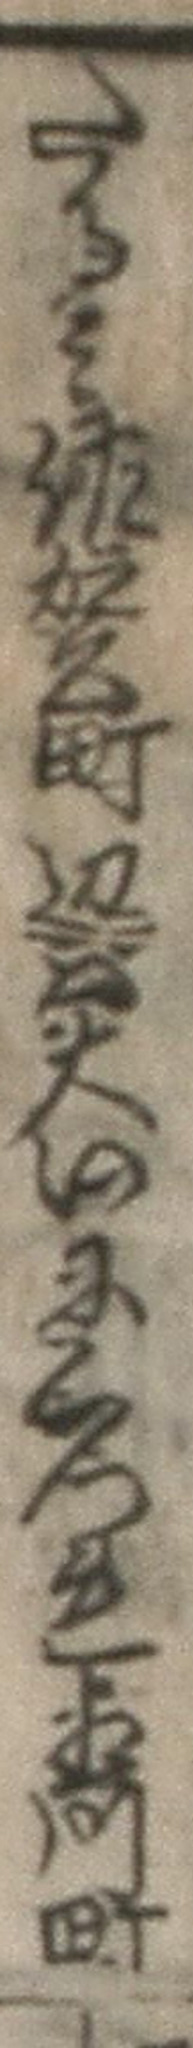たるみ佐賀町辺は大いにくつれ相川町
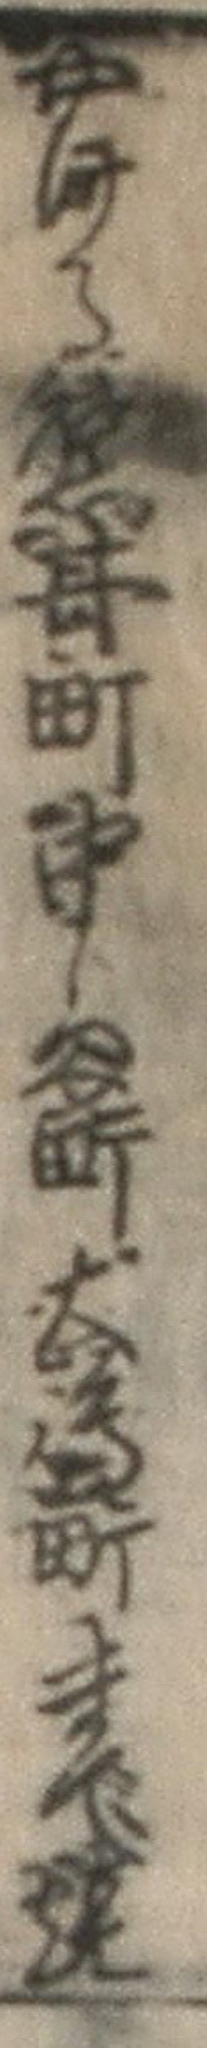やける熊井町中谷町大嶋町まで焼
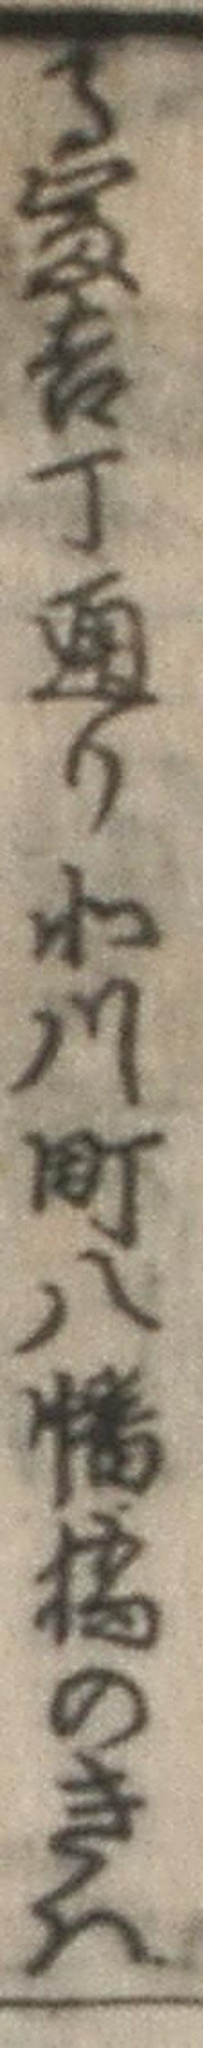る富吉丁通り北川町八幡橋のきは
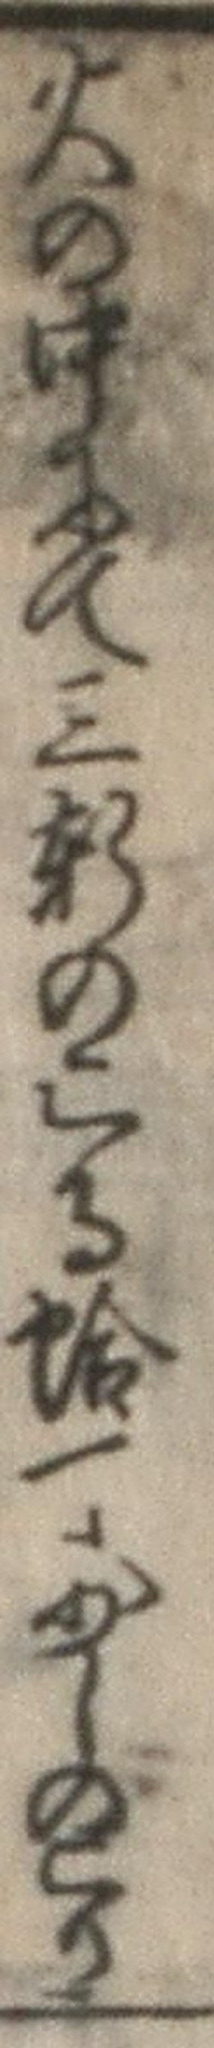火の中にて三軒のこる蛤丁少しのこり
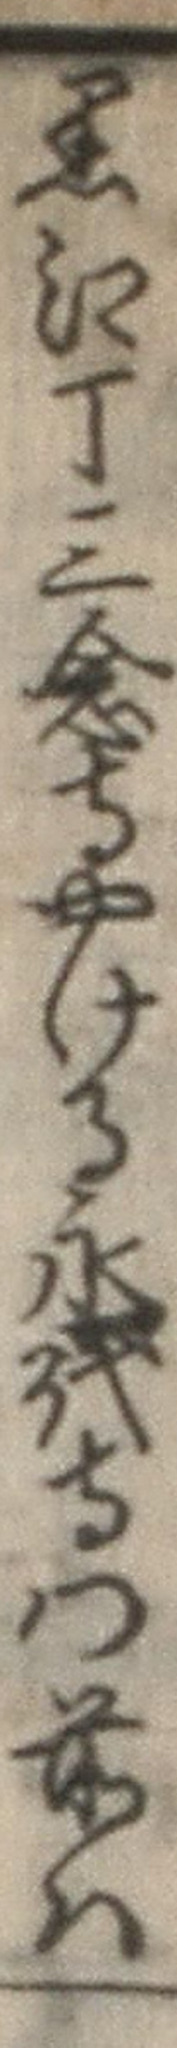黒江丁三倉寺やける永代寺門前は
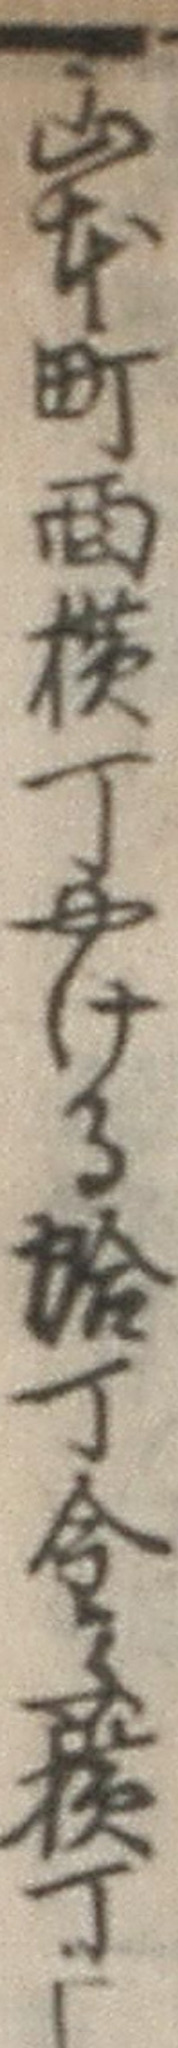山本町西横丁やける蛤丁金子横丁
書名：江戸大地震末代鑑
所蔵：東京大学地震研究所図書室 Earthquake Research Institute Library, The University of Tokyo, JAPAN
